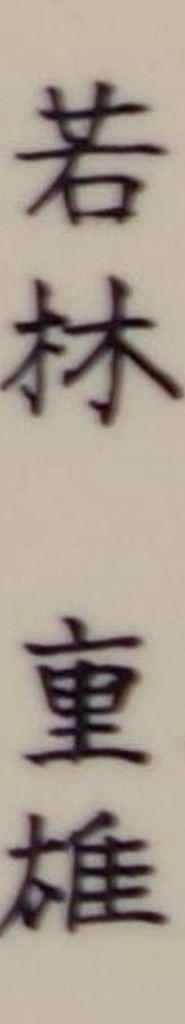若林重雄
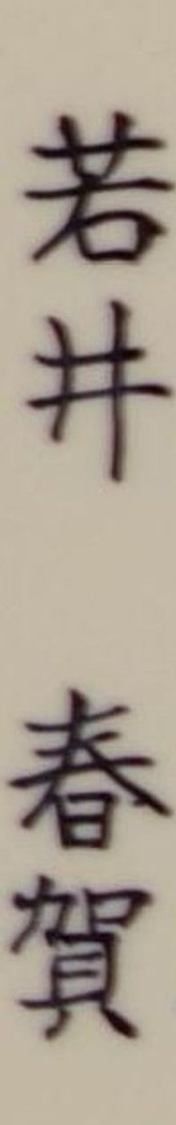若井春賀
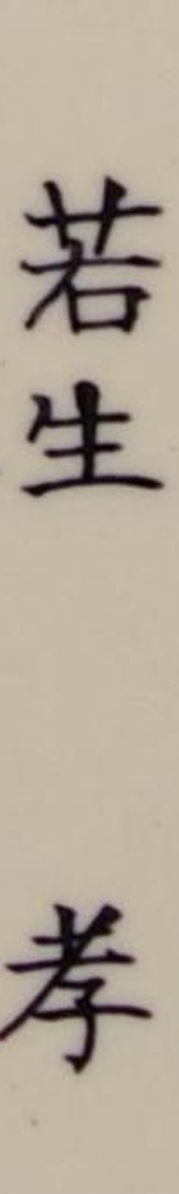若生孝
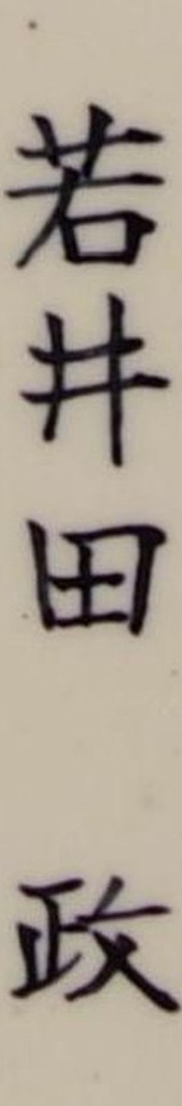若井田政
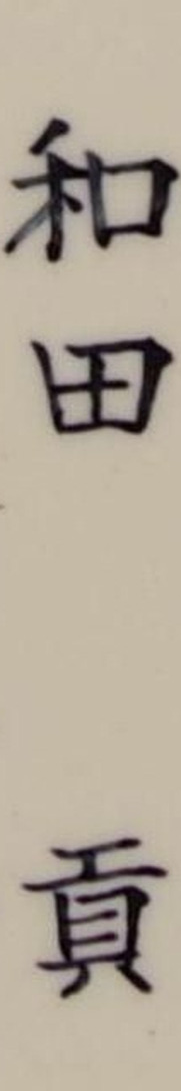和田貢
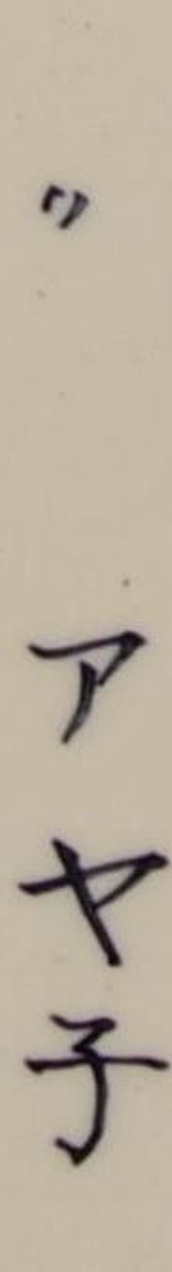アヤ子
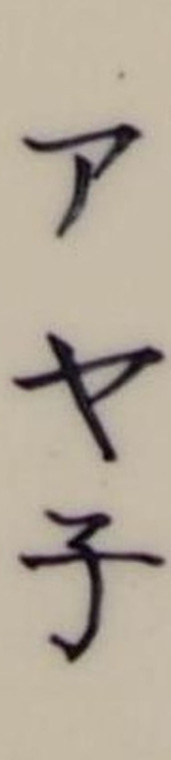アヤ子

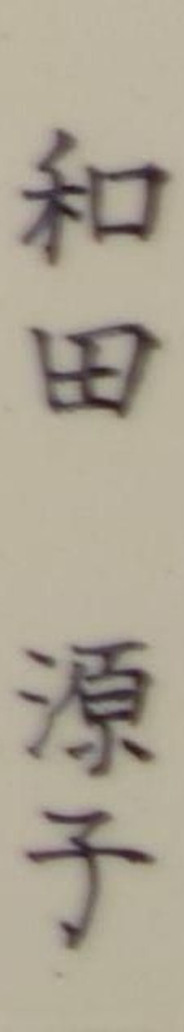和田源子
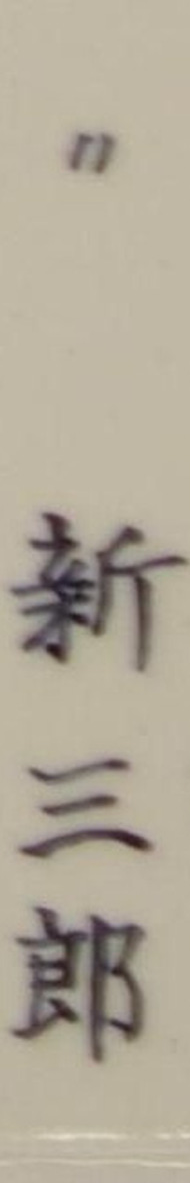新三郎
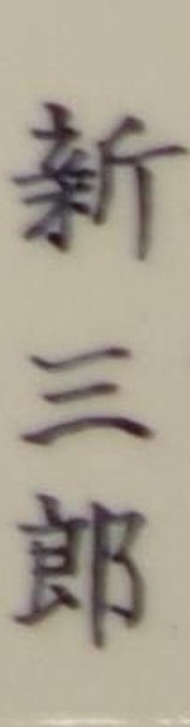新三郎
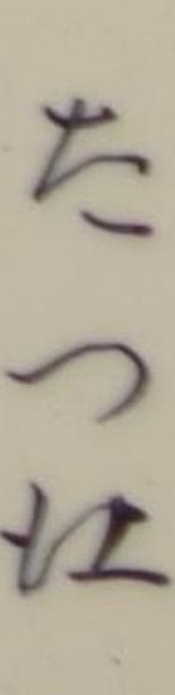たつえ
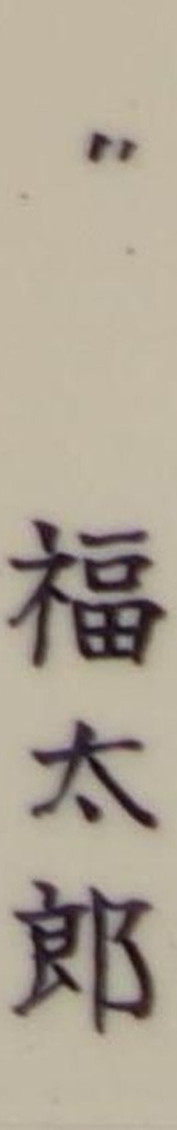福太郎
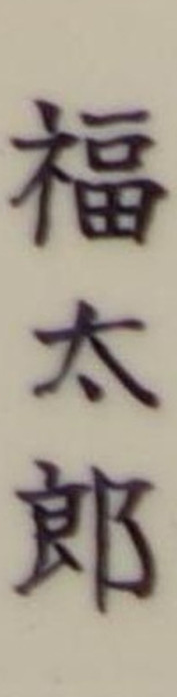福太郎
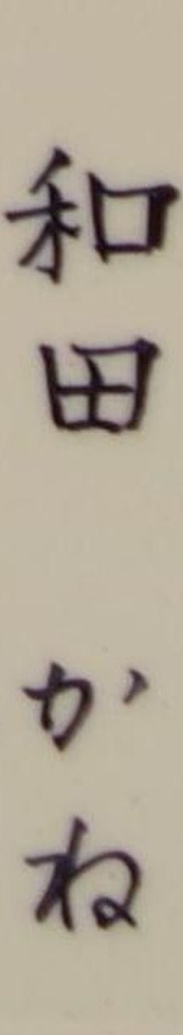和田かね
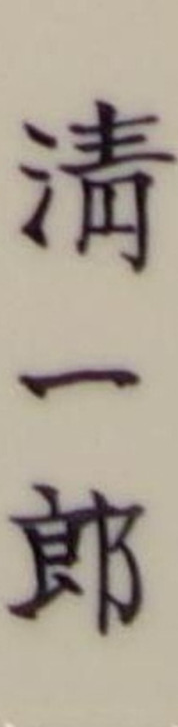清一郎
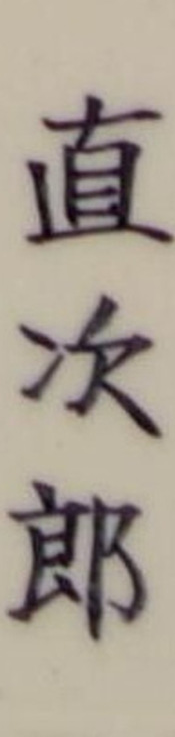直次郎
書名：M~S
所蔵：高野山金剛峯寺
